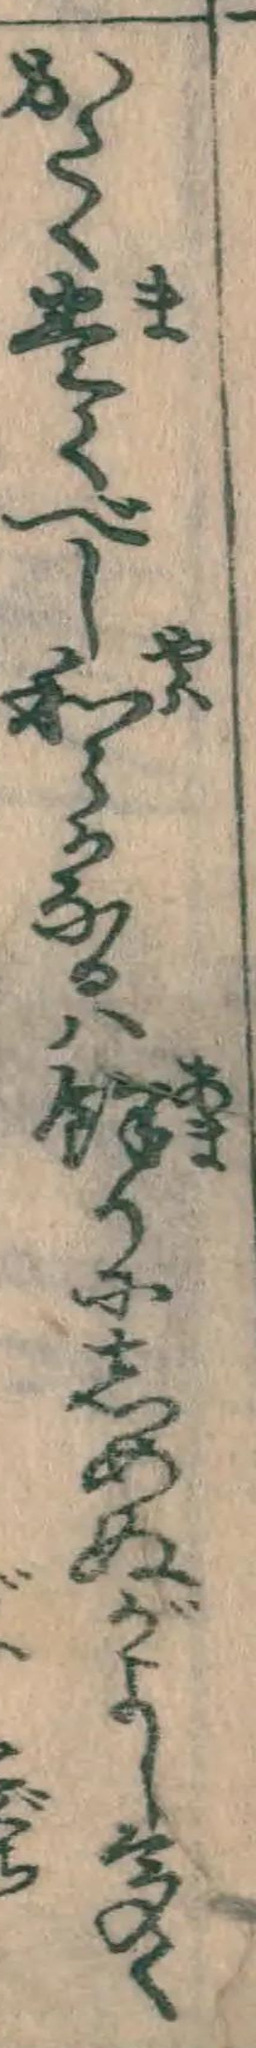かたく巻くべし和らかなるは余りにしめぬがよし多く
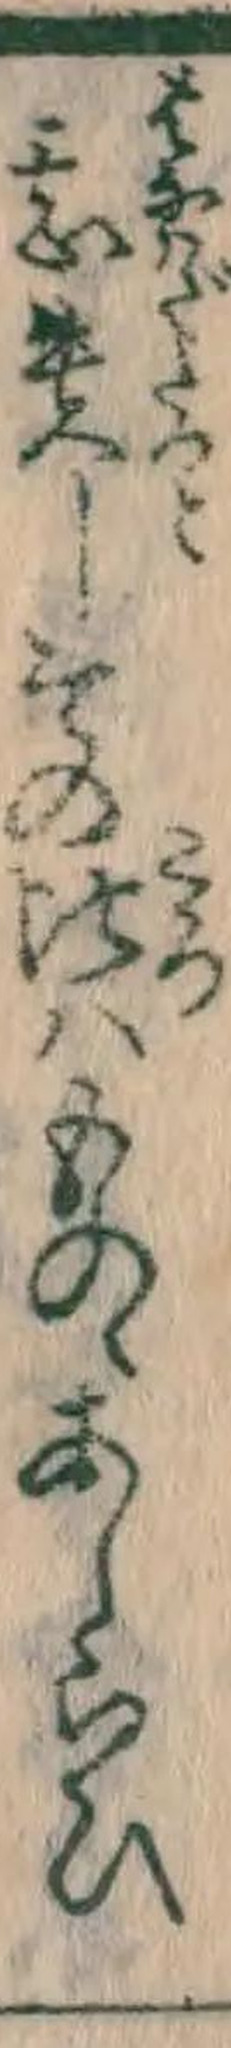甚貴しその比はものゝあしらひ
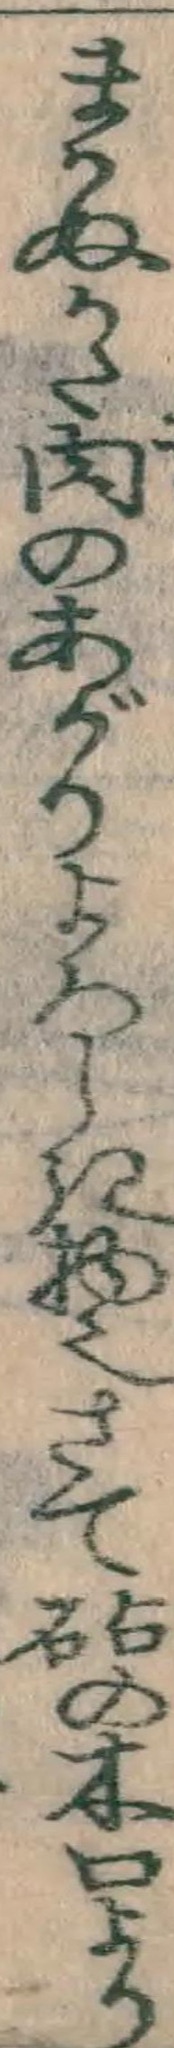まかぬかた肉のあがりよろしき物也さて砧の木口より
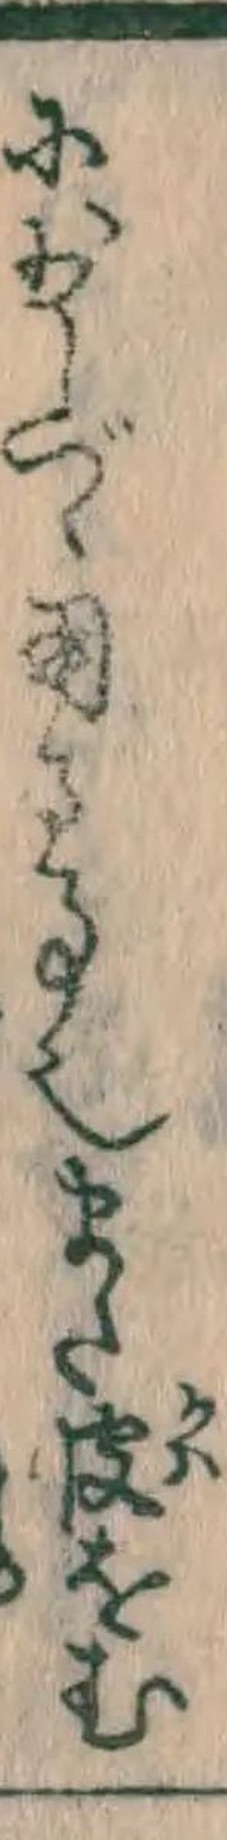に少しづゝ用る事也また皮をむ
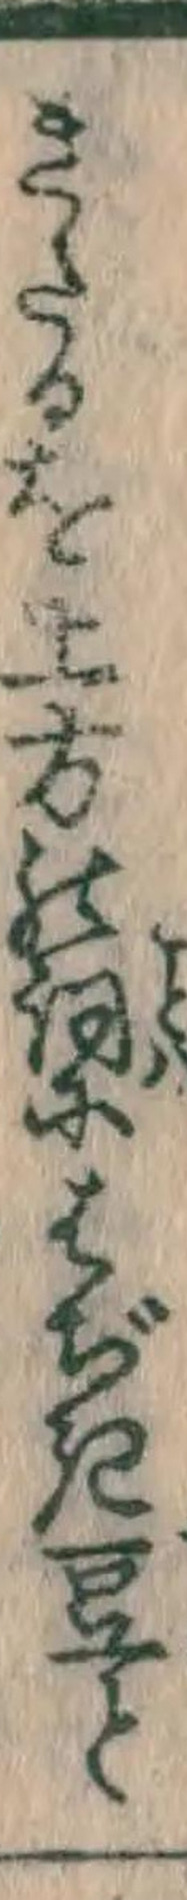きたるを上方の詞にはぢき豆と
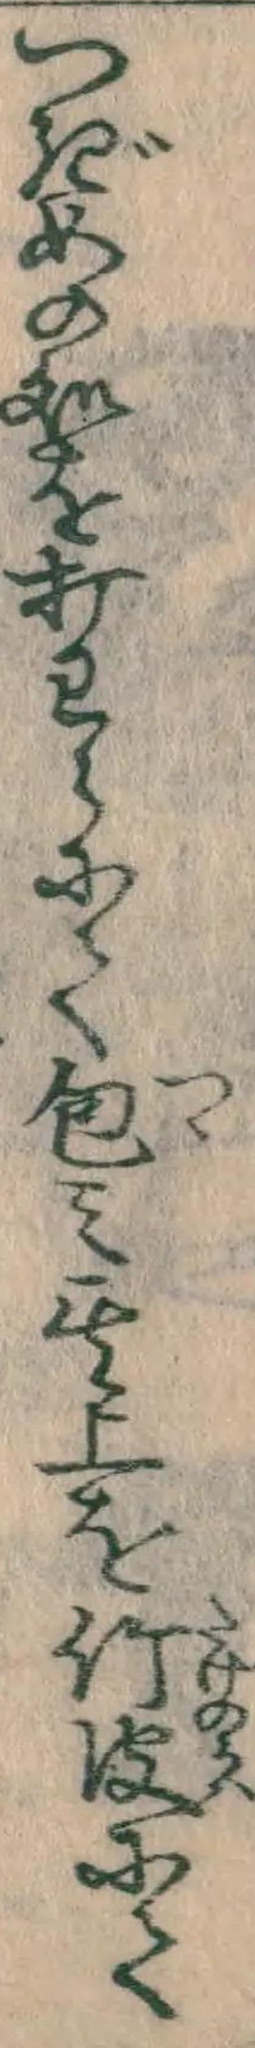つぎめの処を打わらにて包み其上を竹皮にて
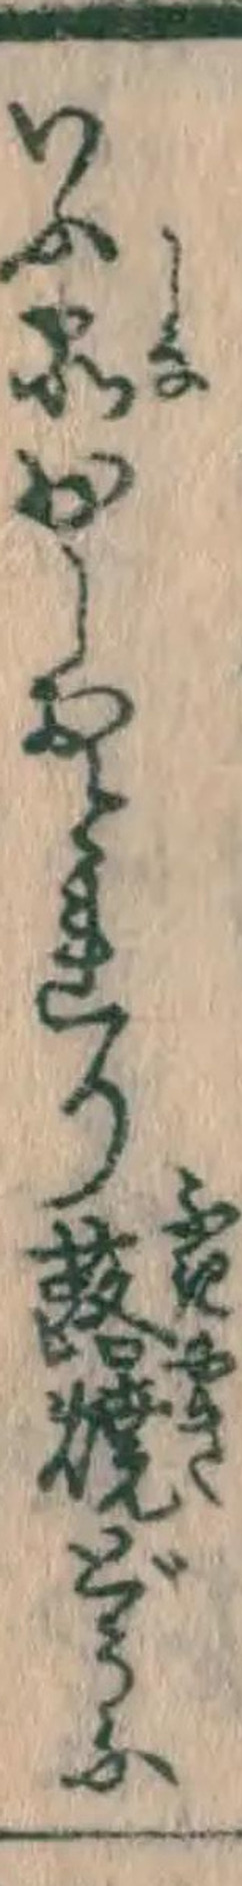いふ品少しおとれり蕗焼どうふ
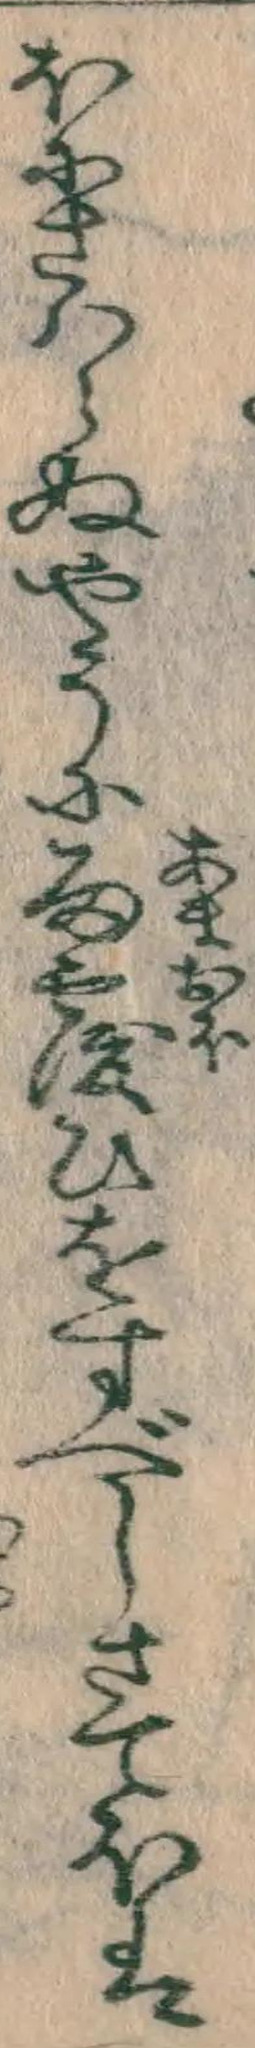ほにさはらぬやうに雨覆ひをすべしさてほは
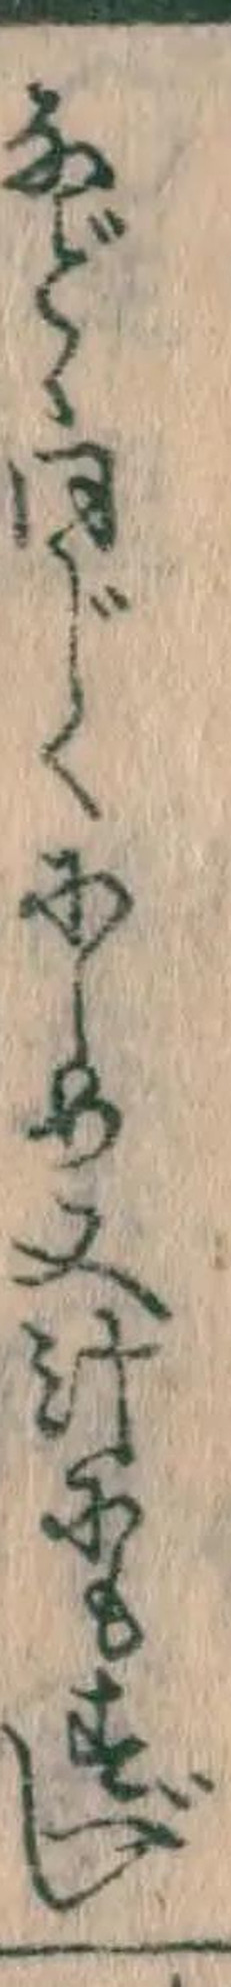などゝ同じくにしめ又汁にもすべし
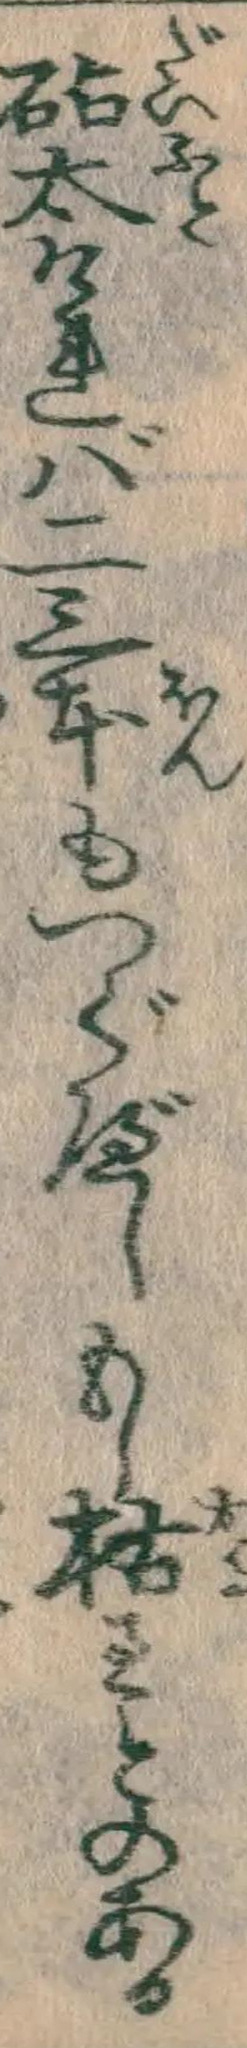砧太ければ二三本もつぐべしもし枯ることのある
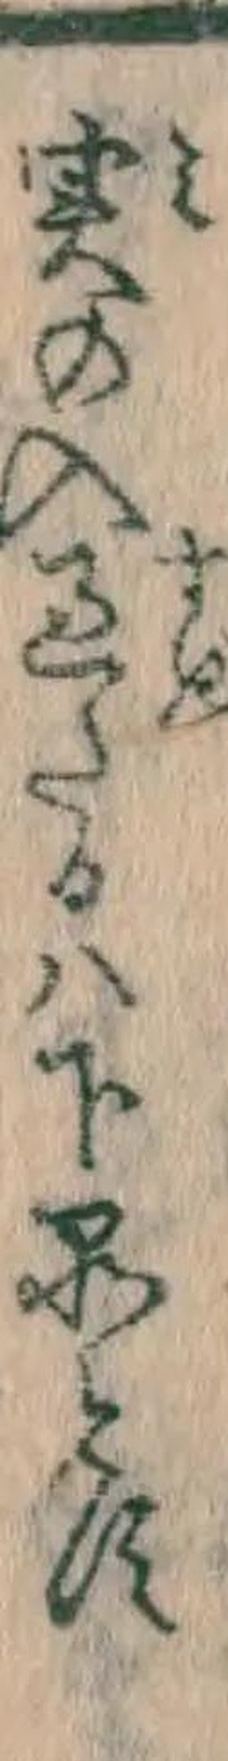実の入過たるは下品とす
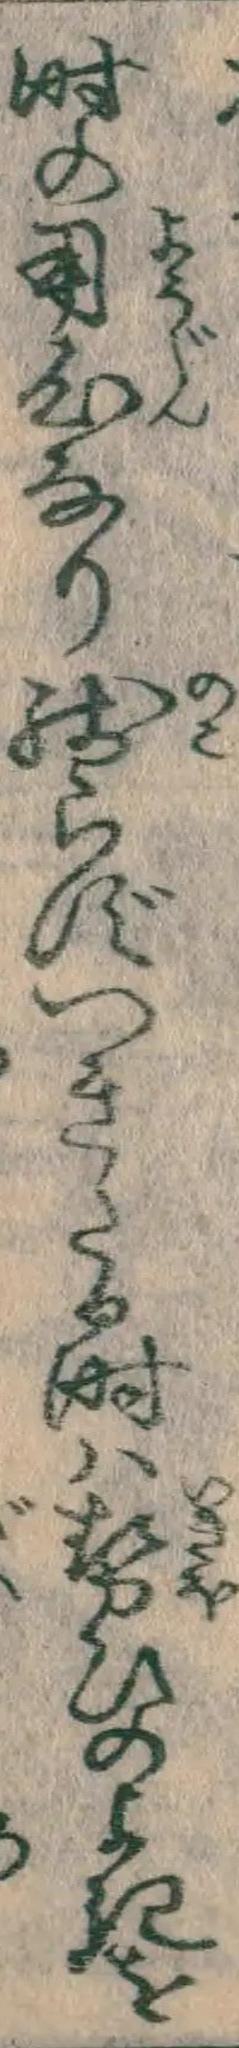時の用心なり残らずつきたる時は勢ひのよきを
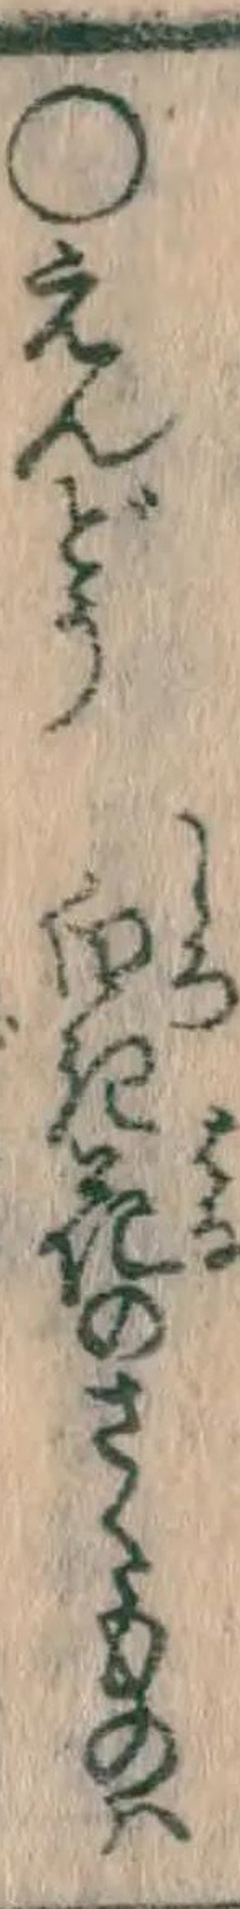○えんどう白き花のさくものは
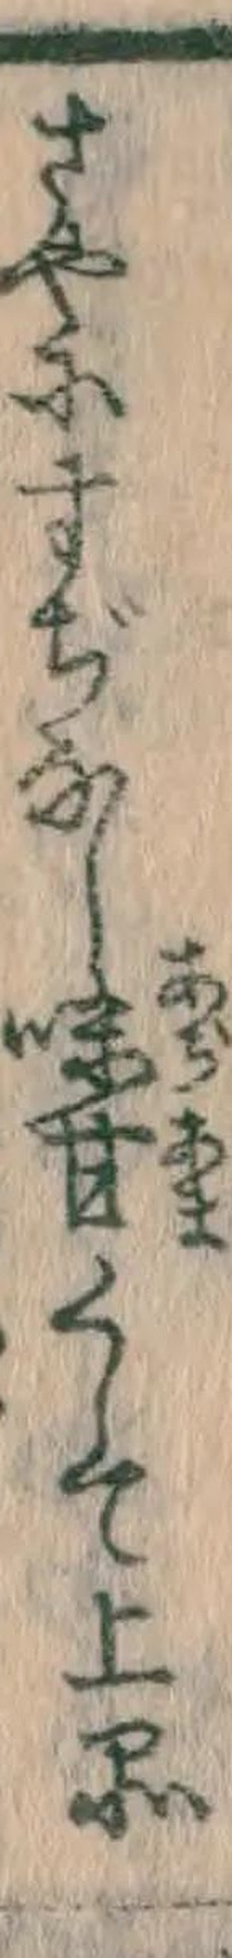さやにすぢなし味甘くして上品
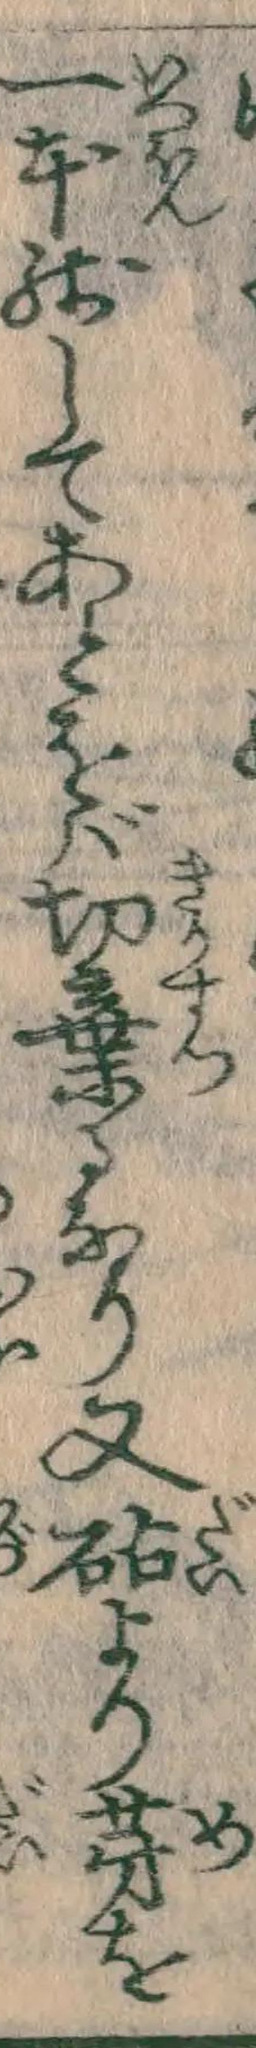一本残してあとをば切棄るなり又砧より芽を
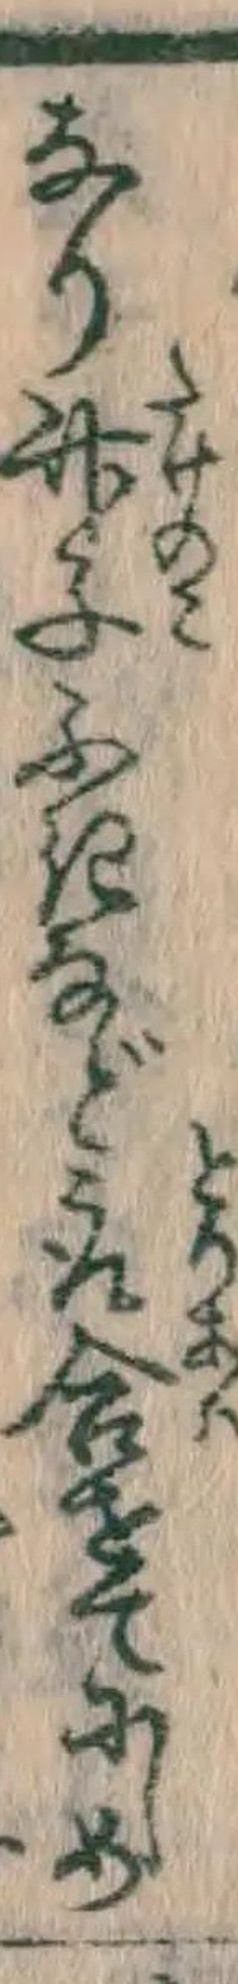なり竹子ふきなど取合せてにしめ
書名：広益秘事大全 3巻. [5]
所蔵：国立国会図書館 National Diet Library, JAPAN
